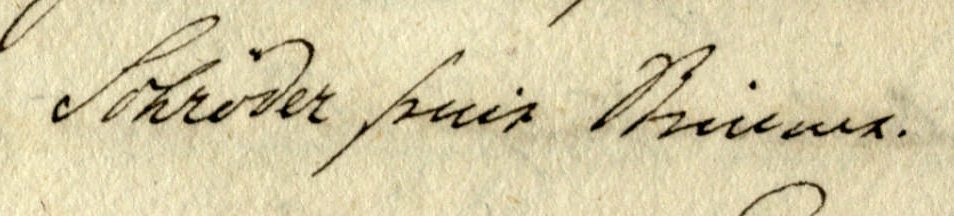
Schröder seine Stimme.
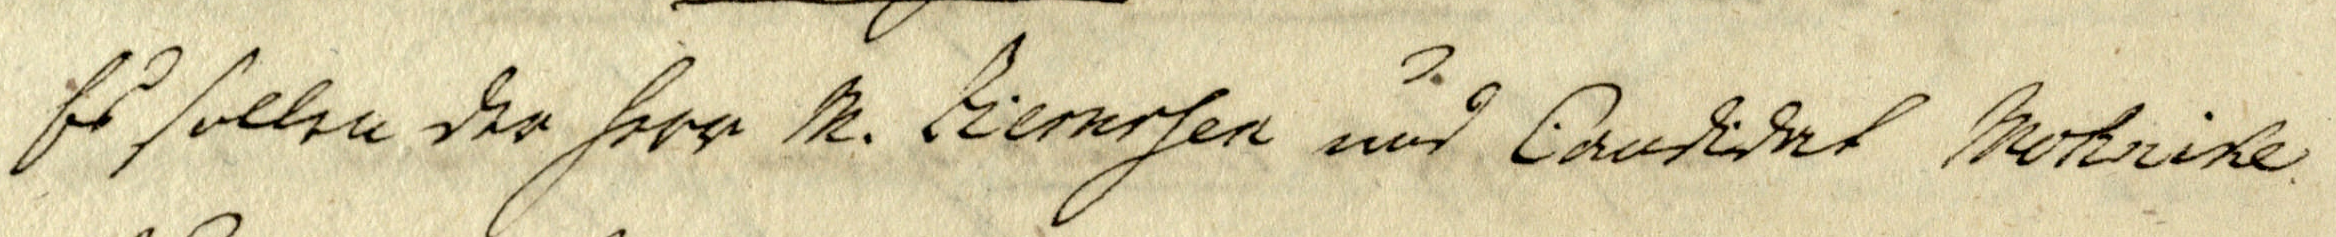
Es sollen der herr M. Ziemssen und Candidat Mohnike
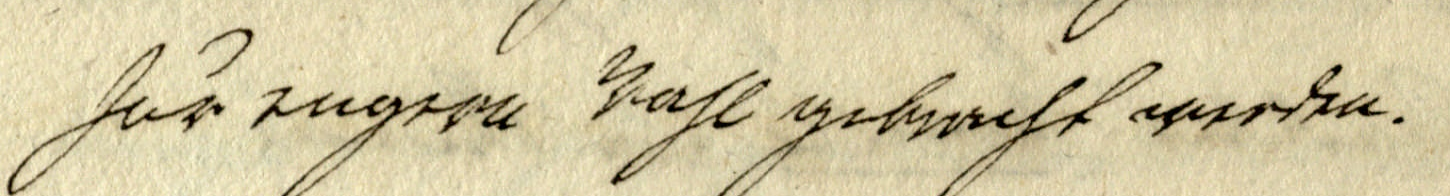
zur engern Wahl gebracht werden.
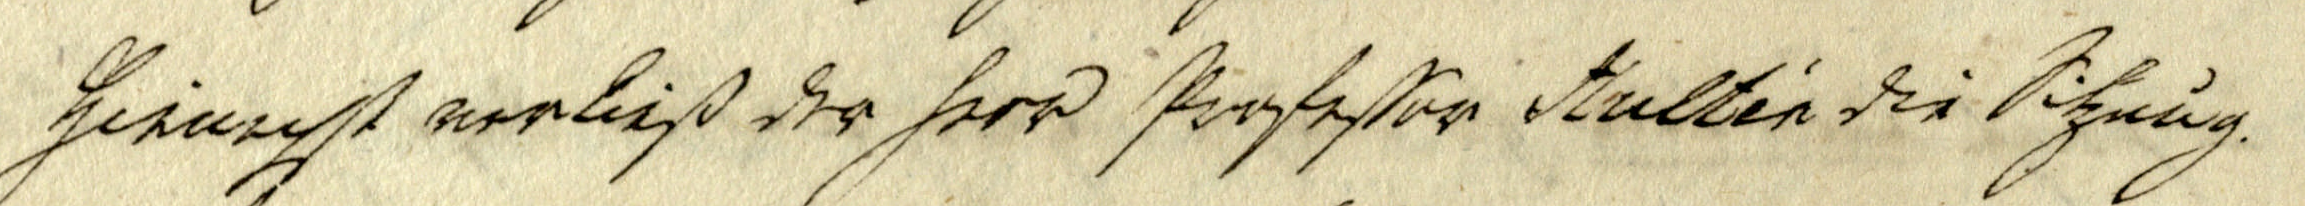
Hienechst verließ der herr Professor Hultèn die Sitzung.
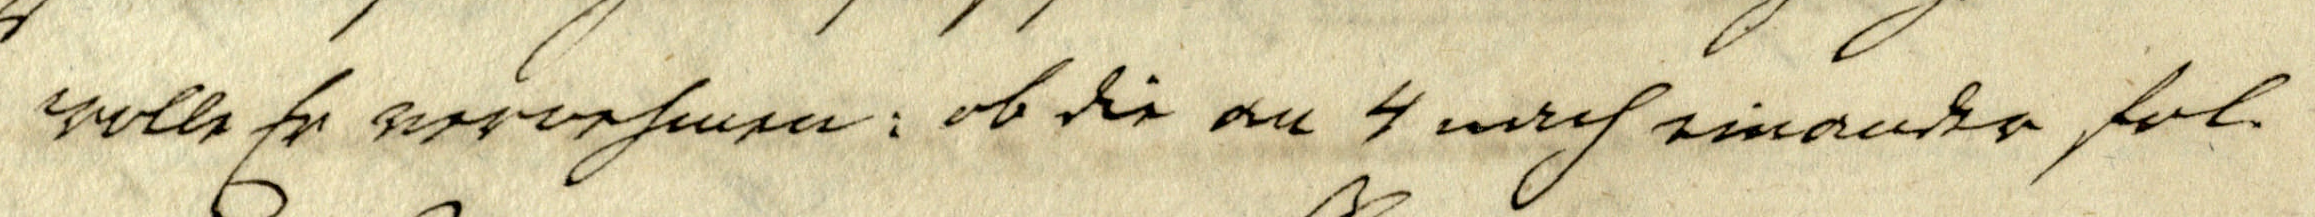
b, Wolle Er vernehmen: ob die an 4 nach einander fol¬
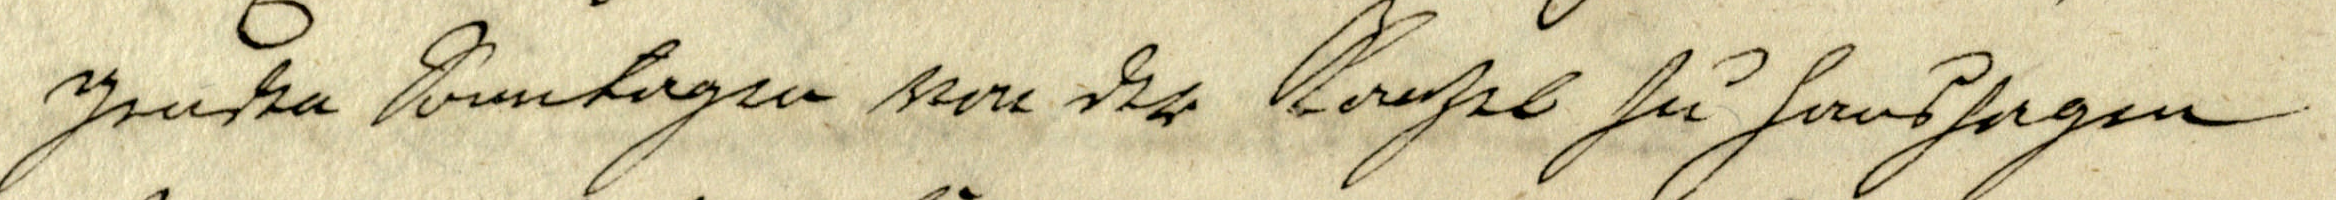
genden Sonntagen von der Kanzel zu hanshagen
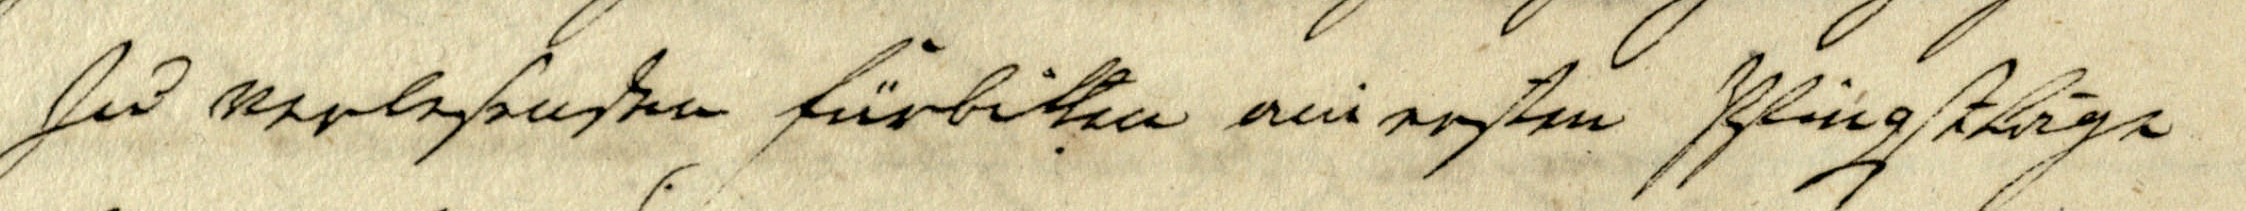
zu verlesenden Fürbitten am ersten Pfingsttage
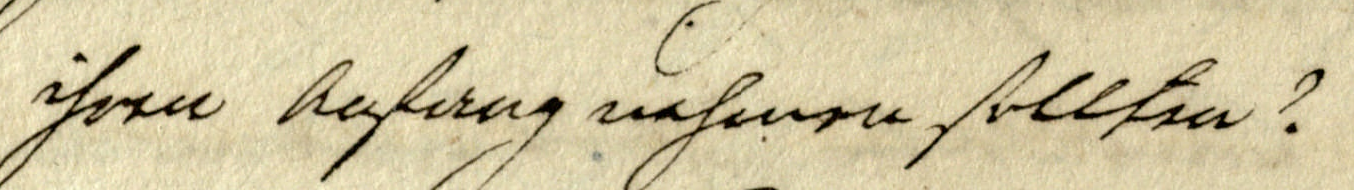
ihren Anfang nehmen sollten?
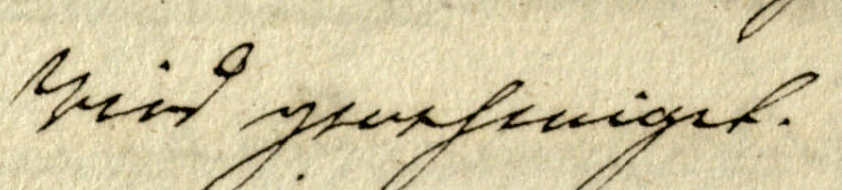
Wird genehmiget.
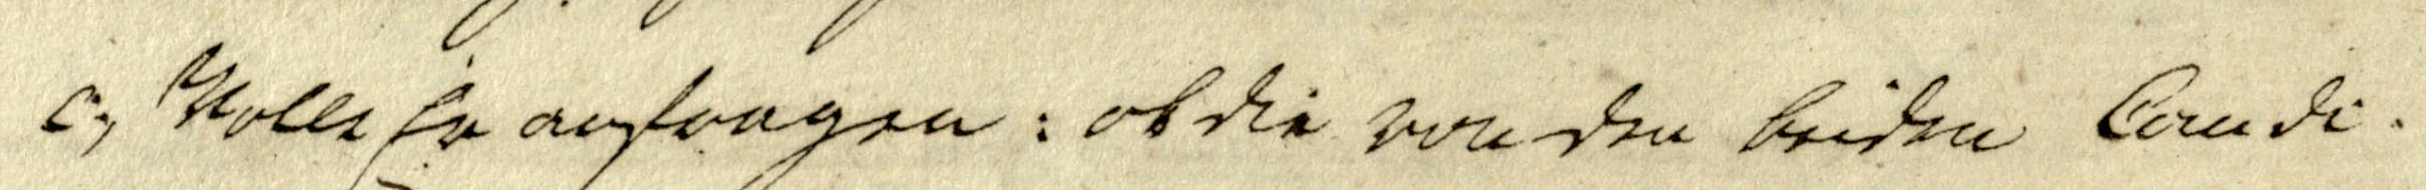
c, Wolle Er anfragen: ob die von den beiden Candi¬
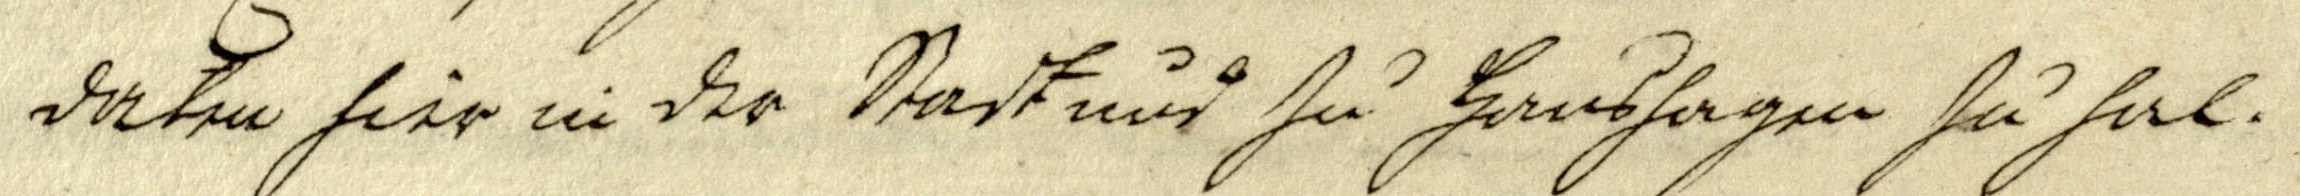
daten hier in der Stadt und zu Hanshagen zu hal¬
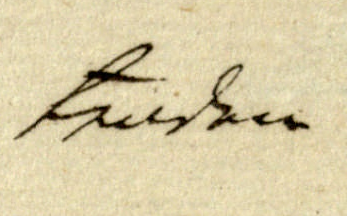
tenden
